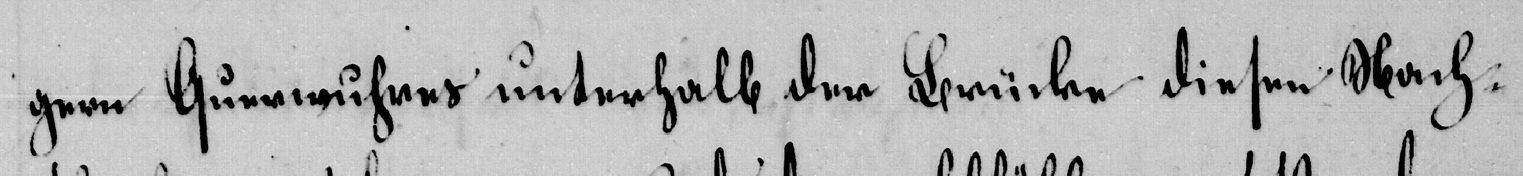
gern Querwuhres unterhalb der Brücke diesen Nach¬
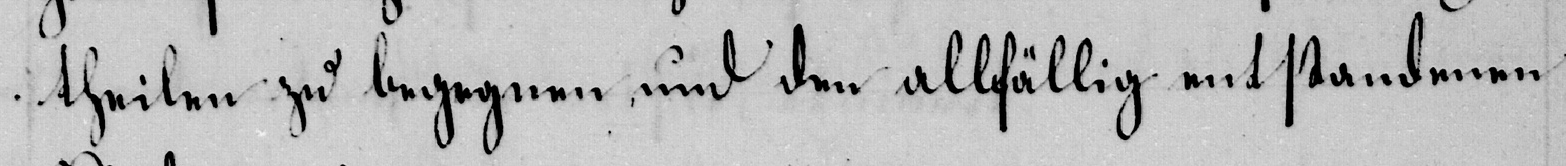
theilen zu begegnen und den allfällig entstandenen
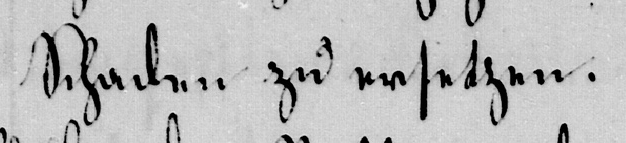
Schaden zu ersetzen.
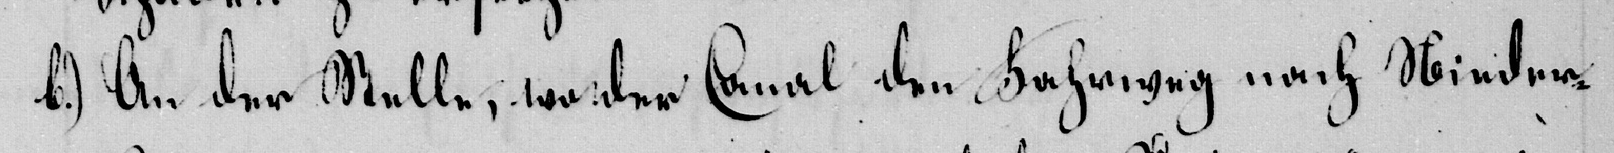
b.) An der Stelle, wo der Canal den Fahrweg nach Niede¬
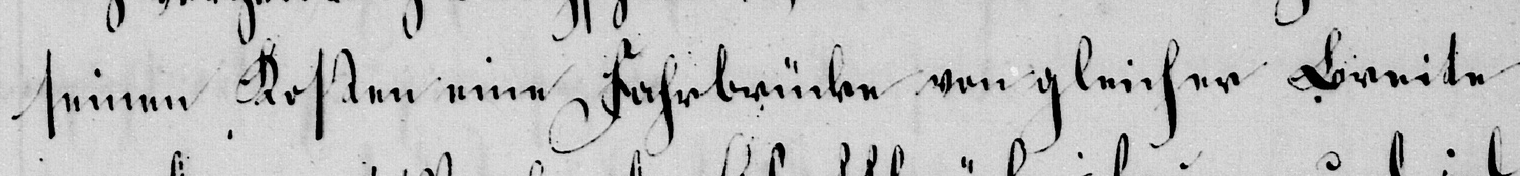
seinen Kosten eine Fahrbrücke von gleicher Breite
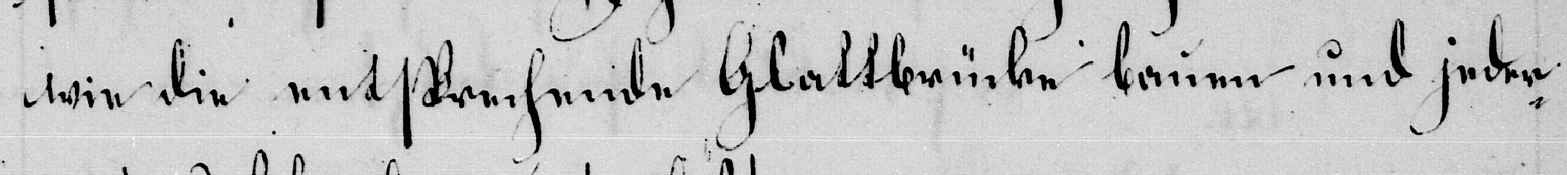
wie die entsprechende Glattbrücke bauen und jeder¬
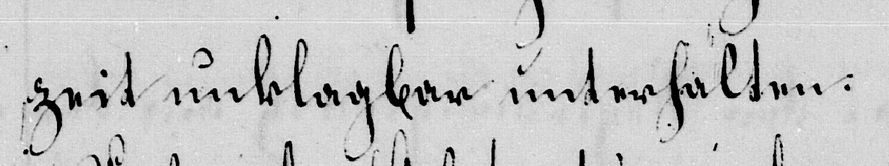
zeit unklagbar unterhalten.
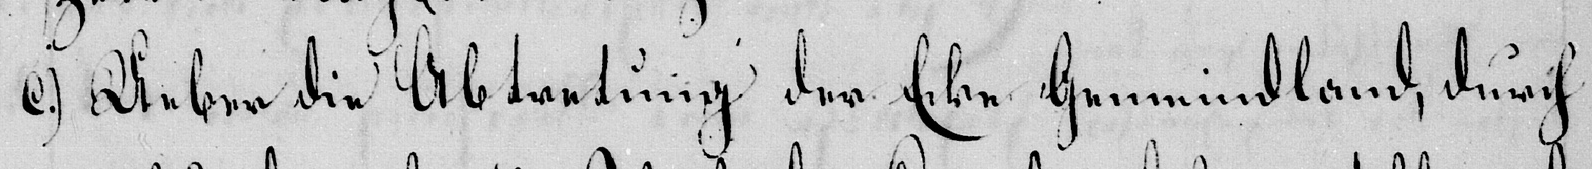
c.) Ueber die Abtretung der Ecke Gemeindland, durch
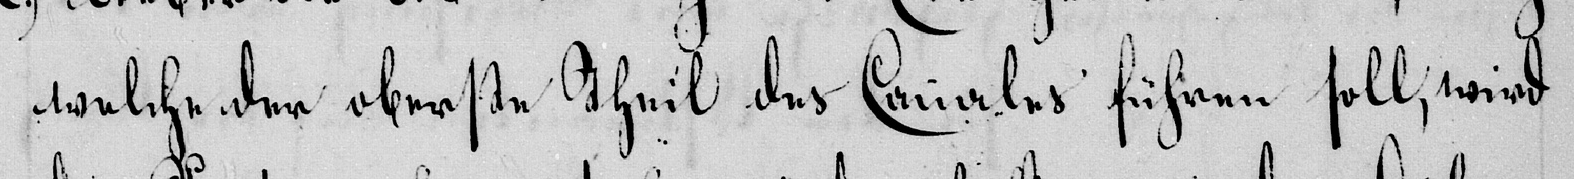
welche der oberste Theil des Canales führen soll, wird
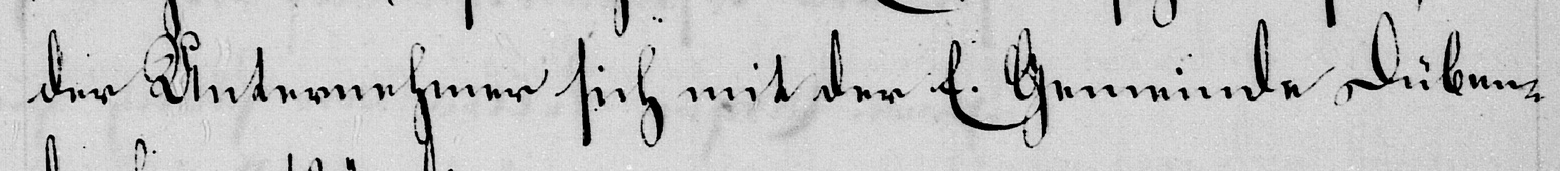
der Unternehmer sich mit der E. Gemeinde Düben¬
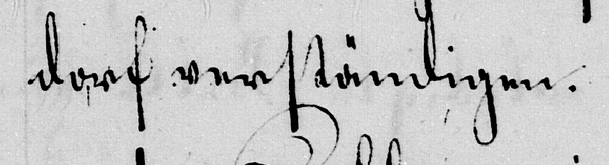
dorf verständigen.
